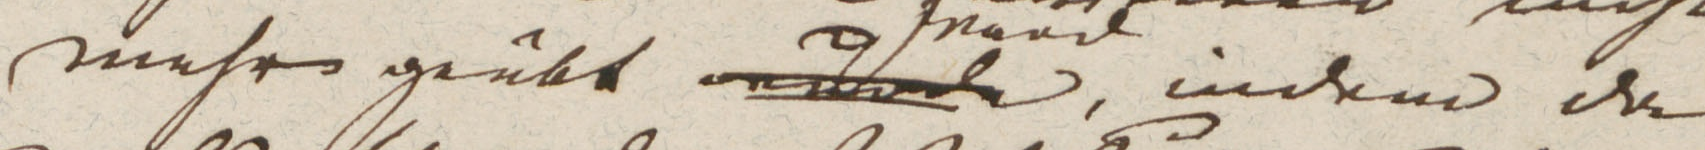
mehr geübt wurde ward, indem da-
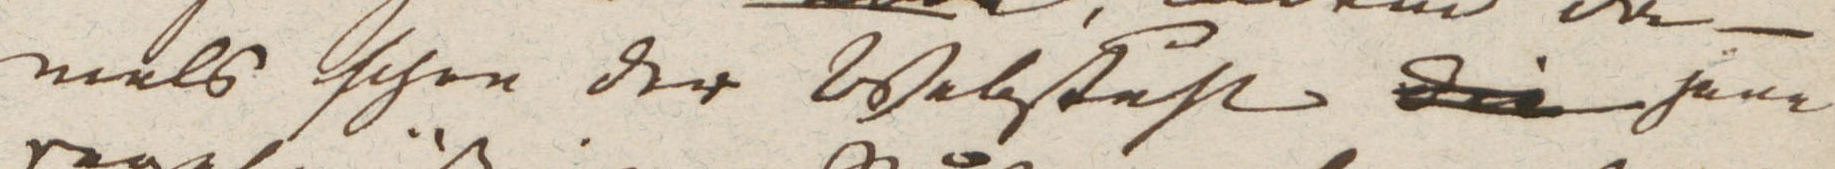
mals schon der Webstuhl die jene
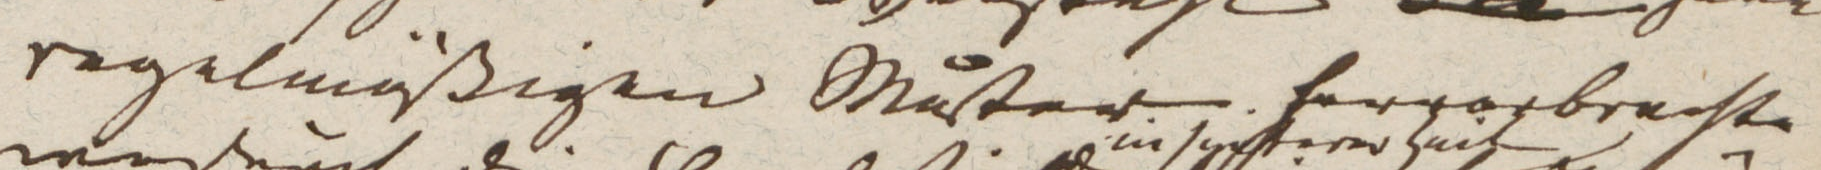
regelmässigen Muster hervorbrachte
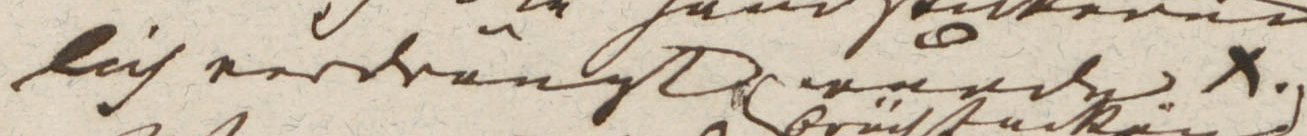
lich verdrängt wurde. %
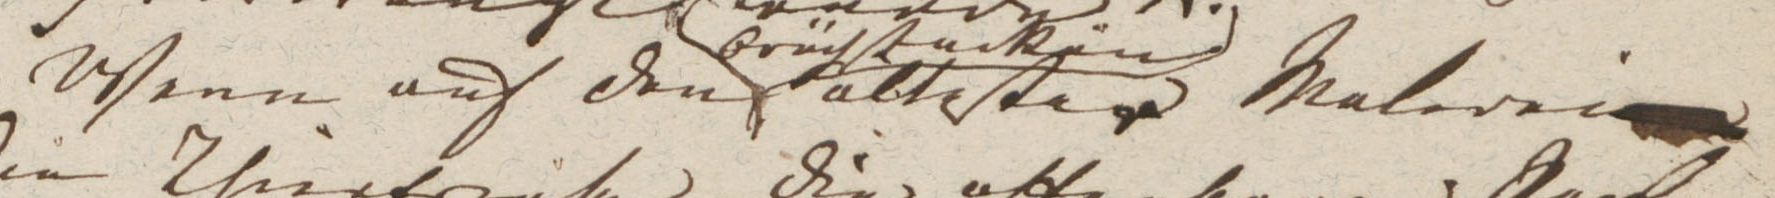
Wenn auf den Brüchstucken ältestenr Malereien
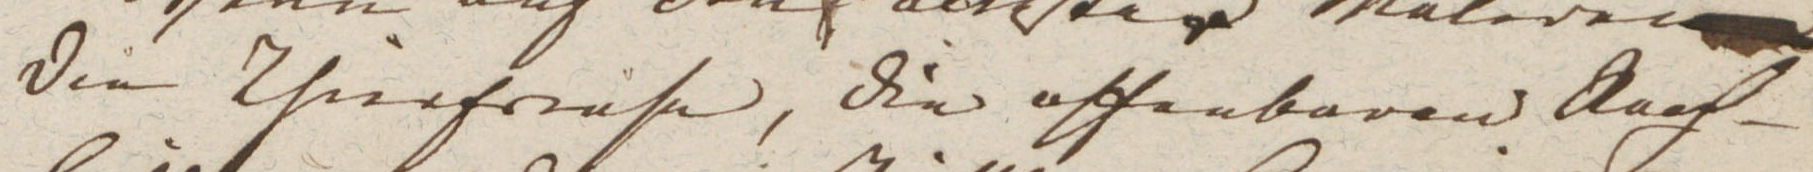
die Thierfriese, die offenbaren Nach-
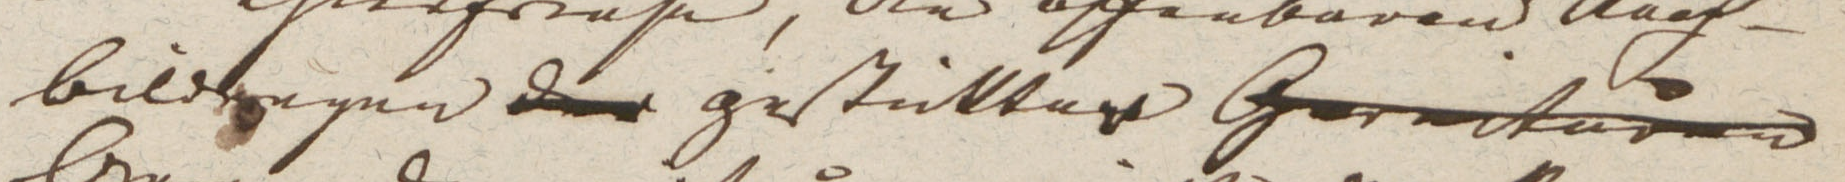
bildungen der gesticktenr Garnituren
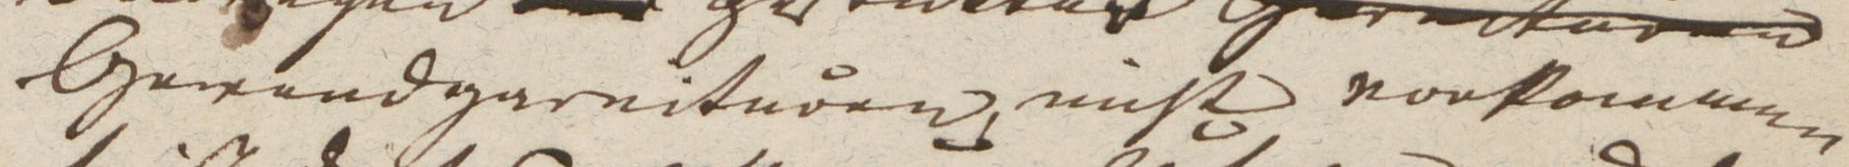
Gewandgarnituren, nicht vorkommen
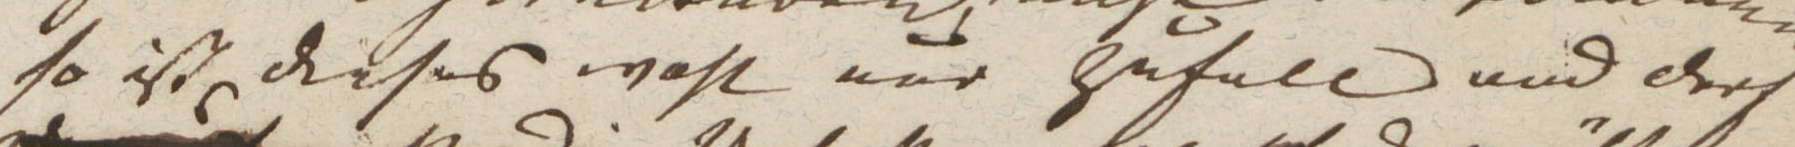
so ist dieses wohl nur Zufall und darf
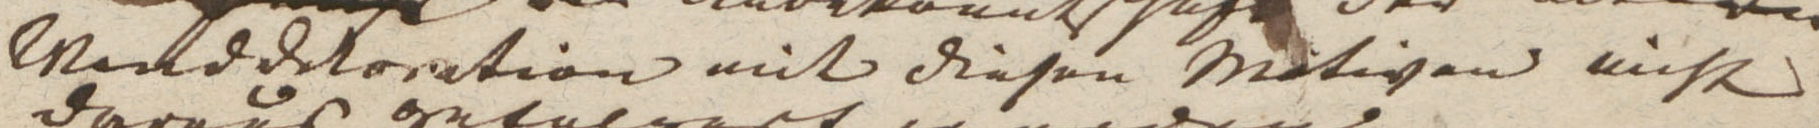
Wanddekoration mit diesen Motiven nicht
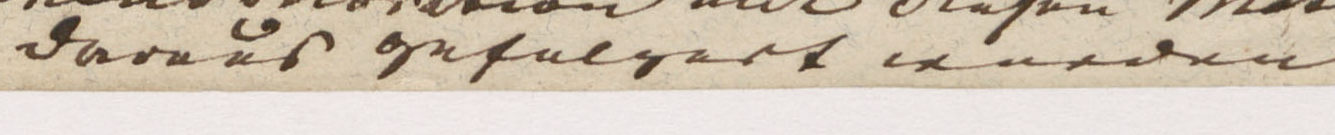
daraus gefolgert werden.
